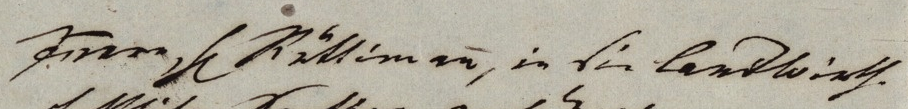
Innern, H Rüttimann, in die landwirth-
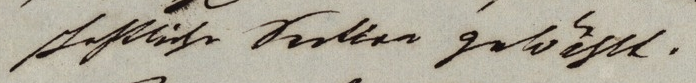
schaftliche Section gewählt.
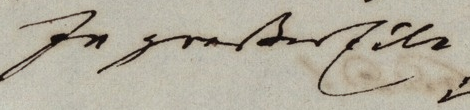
In großer Eile
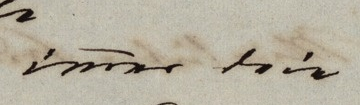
Immer Dein
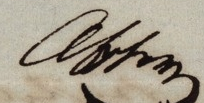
A Escher
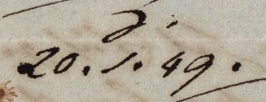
20. 1. 49.
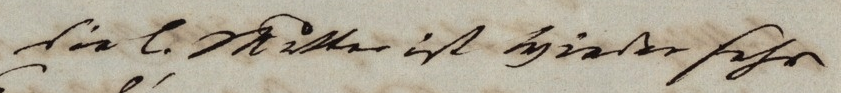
Die l. Mutter ist wieder sehr
